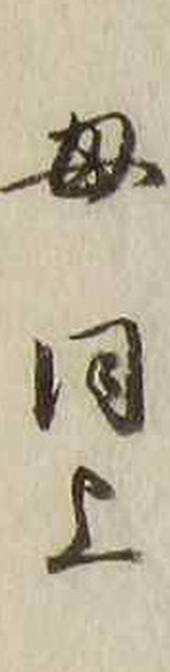母同上

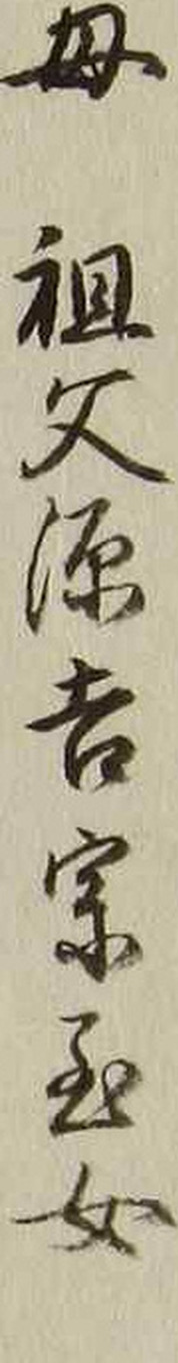母祖父源吉宗至女
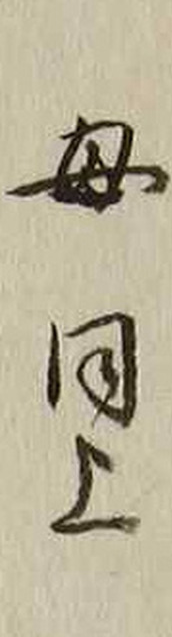母同上
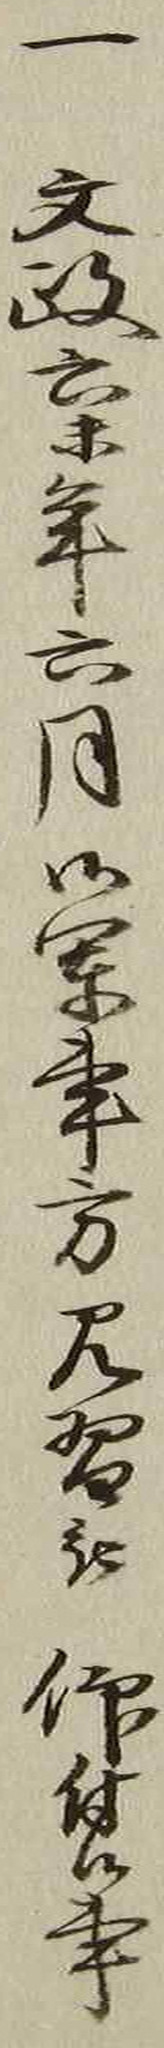一文政六未年六月御軍事方見習被仰付候事
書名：諸士系譜　巻之102　か之部10
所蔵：会津若松市立会津図書館
